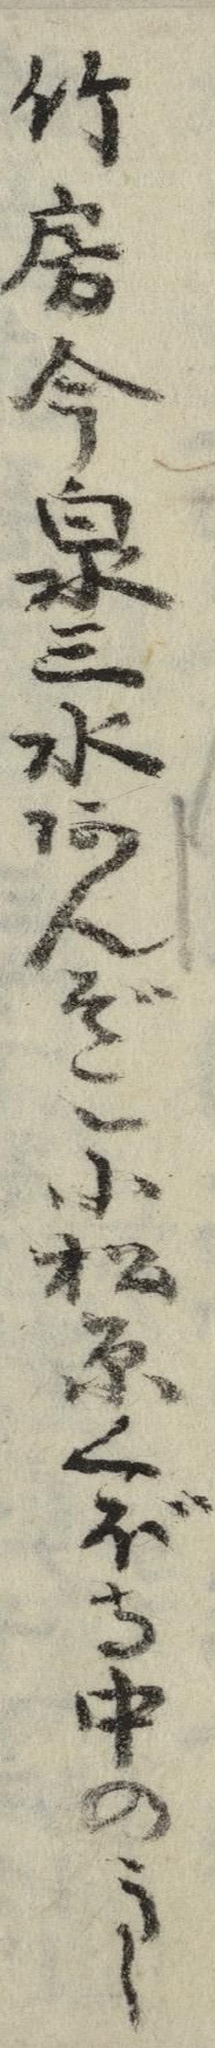竹房今和泉三水何んぞこ小松くぼ寺なかのうし
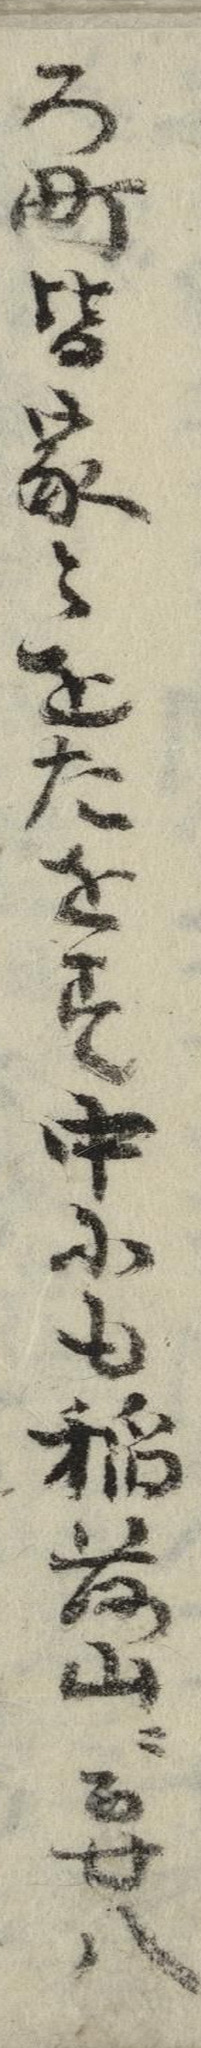ろ町皆家々をたをす中にも稲荷山二而廿八
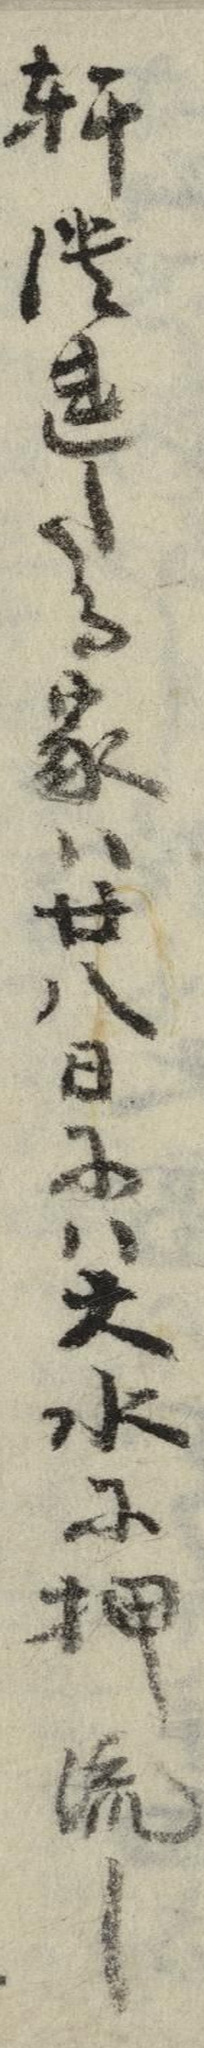軒潰れたる家ハ廿八日にハ大水に押流し
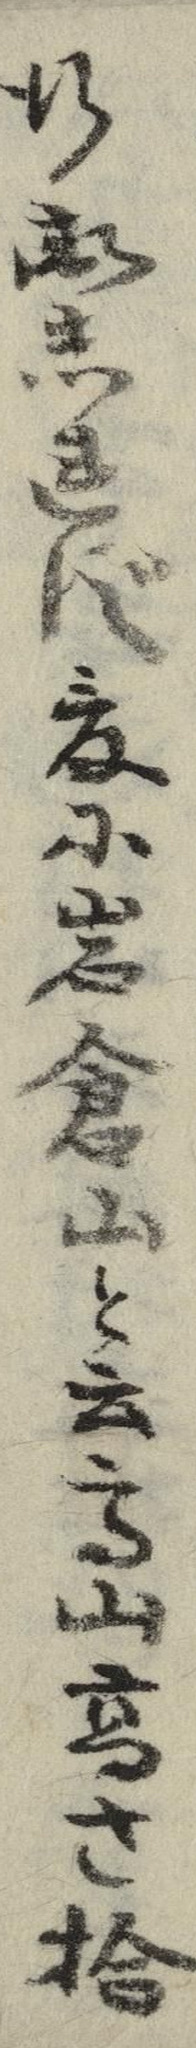行衛しれず爰に岩倉山と云高山高さ拾

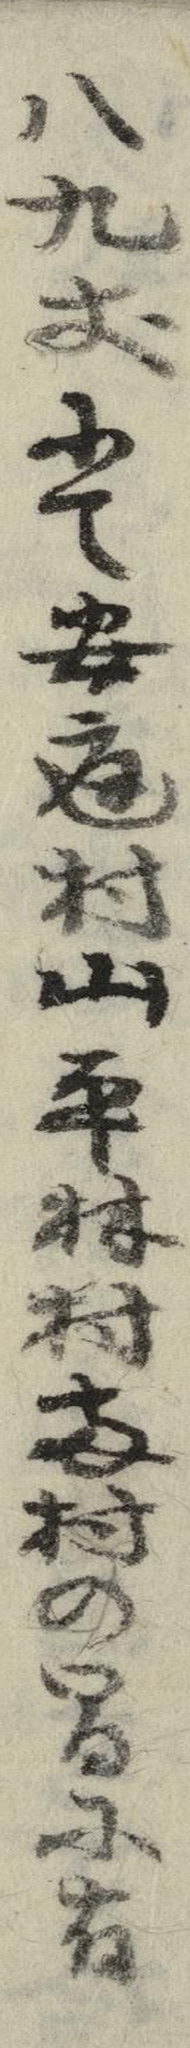八九丈にて安庭村山平林村両村の間二有
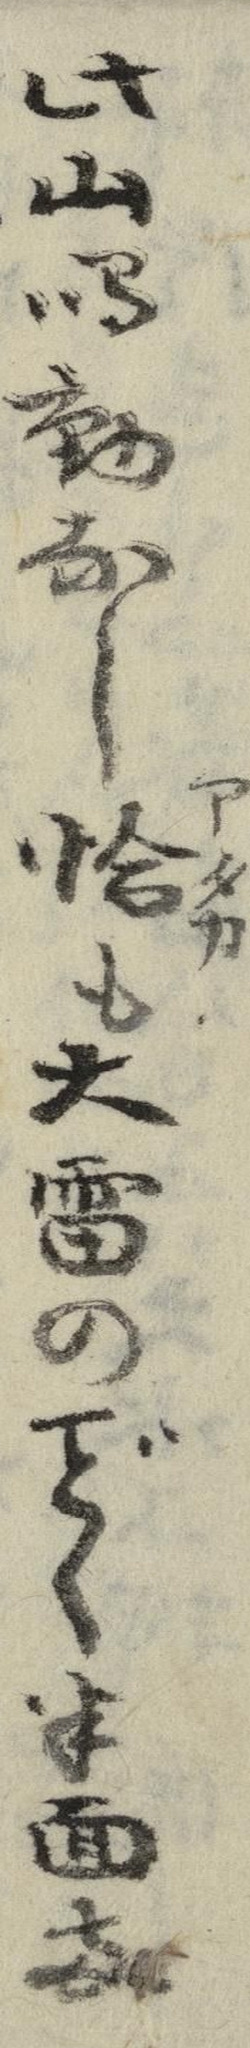此山鳴動なし恰も大雷のごとく半面両
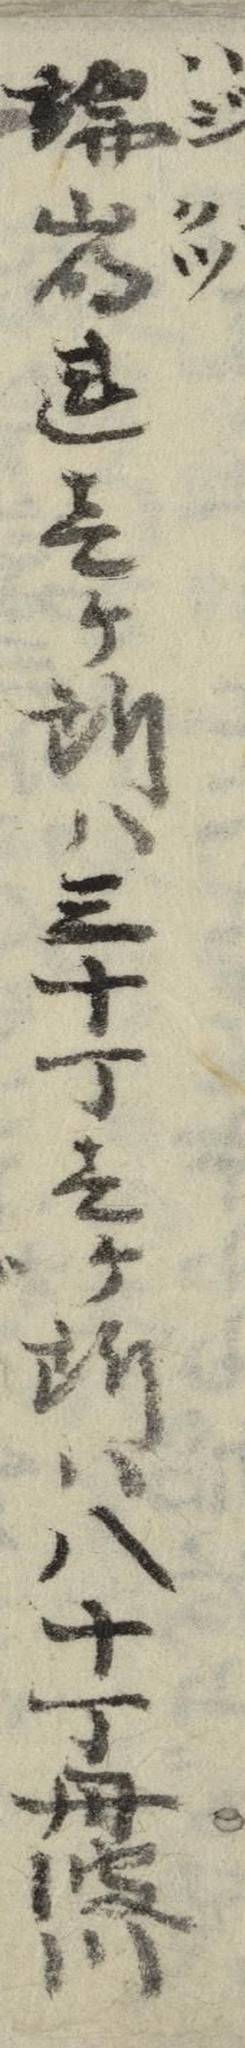端崩れ壱ヶ所ハ三十丁壱ヶ所ハ八十丁丹波川
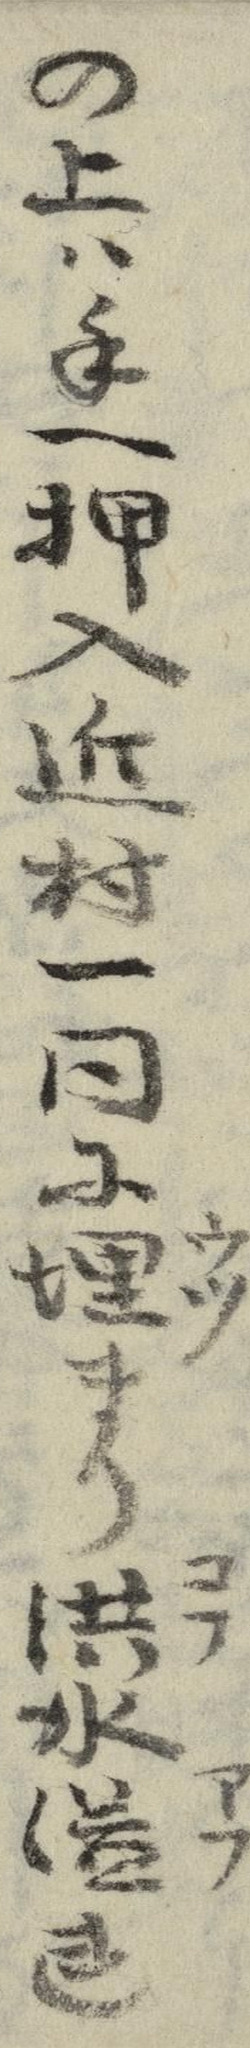の上ハ手へ押入近村一同に埋まり洪水溢れ
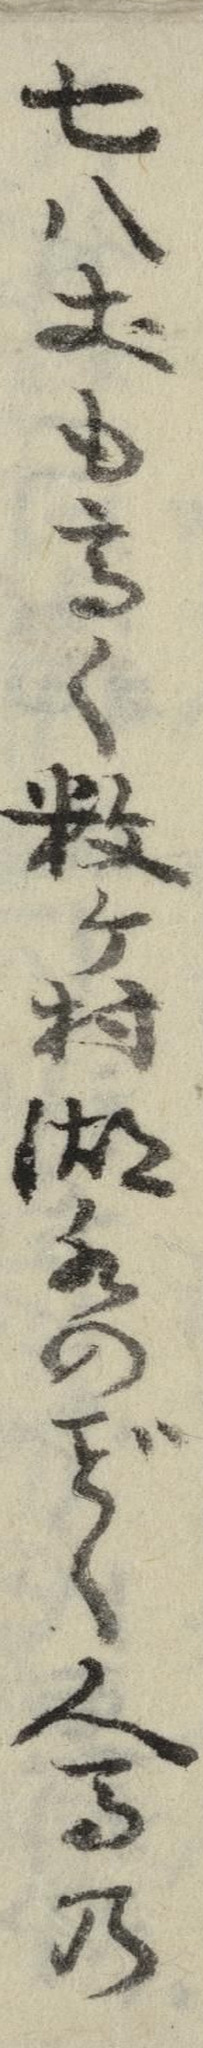七八丈も高く数ヶ村湖水のごとく人馬乃
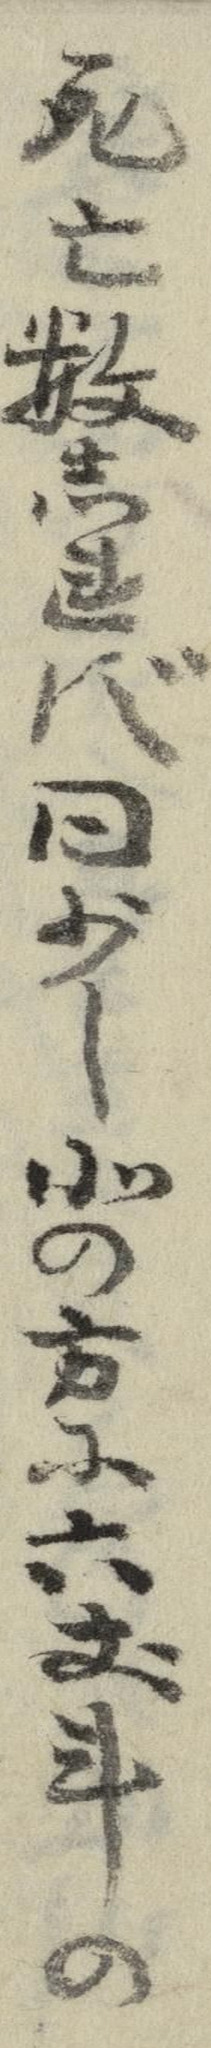死亡数しれず同少し北の方に六丈計の
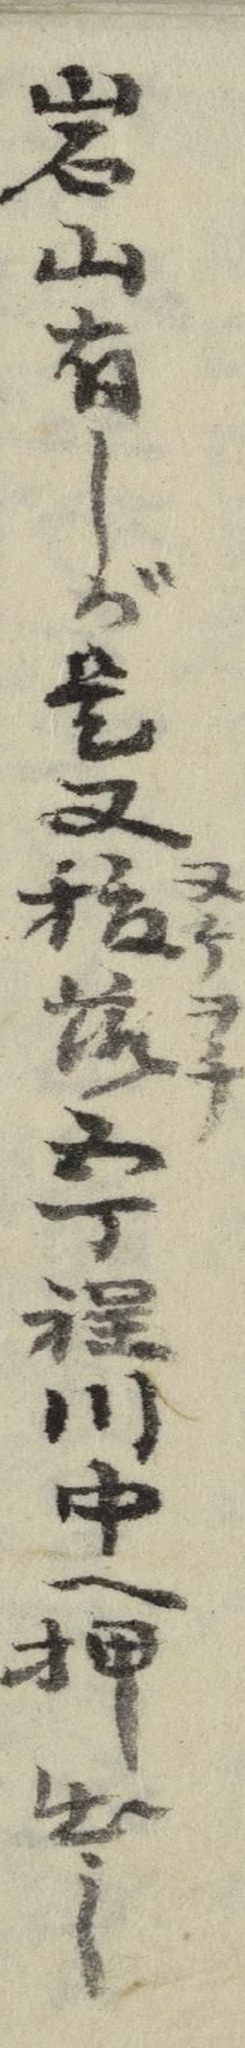岩山有しが是又抜落五丁程川中へ押出し
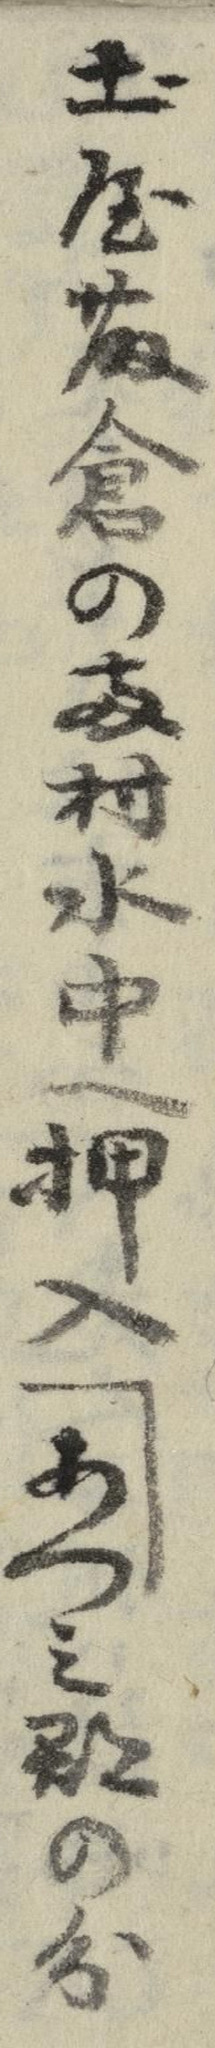土屋藤倉の両村水中へ押入あつみ郡の分
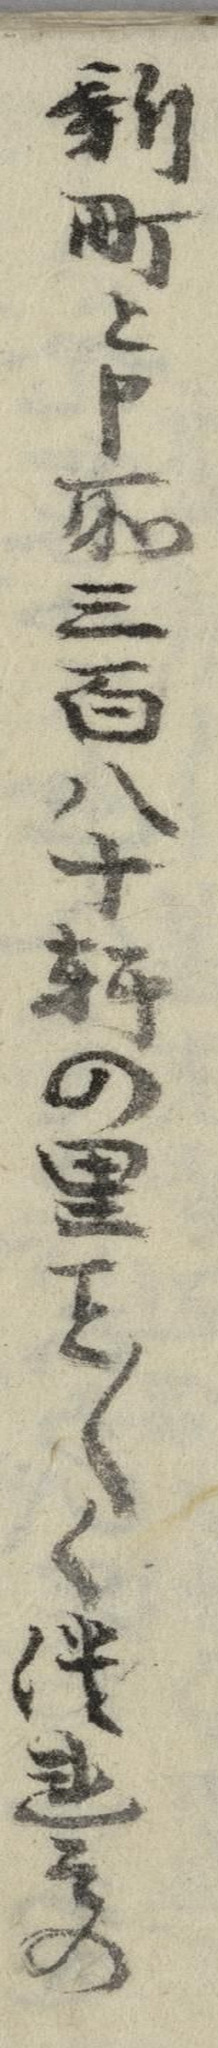新町と申所三百八十軒の里こと〳〵く潰れその
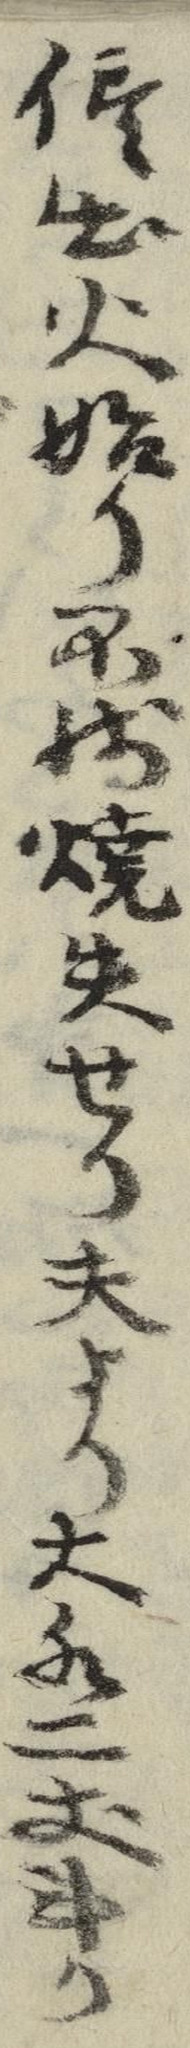侭出火始り不残焼失せり夫より大水二丈計り
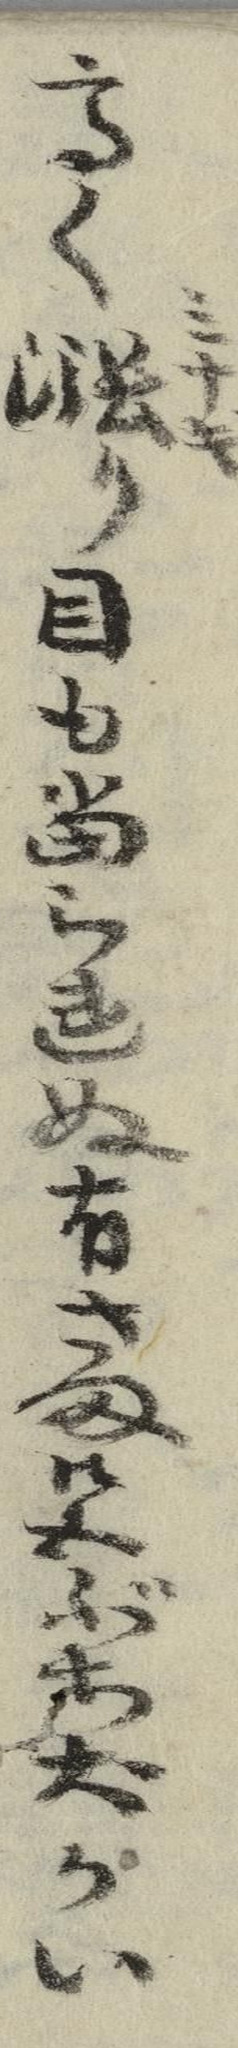高く漲り目も当られぬ有さま宮ぶち犬かい
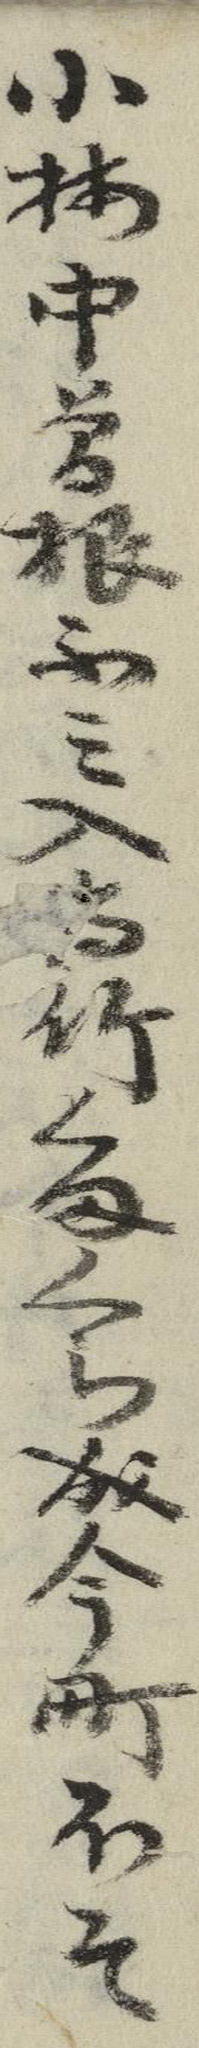小梅中曽根ふみ入寺所くまくら成今町ほそ
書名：信州大地震一件之冩　丁未弘化四年三月吉日
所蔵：東京大学地震研究所図書室 Earthquake Research Institute Library, The University of Tokyo, JAPAN
